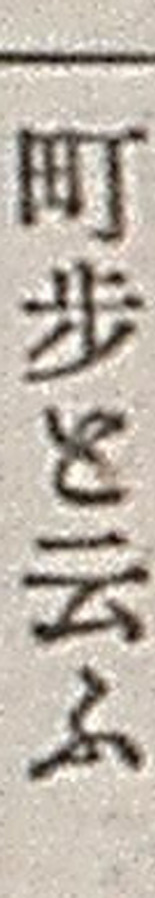町歩と云ふ
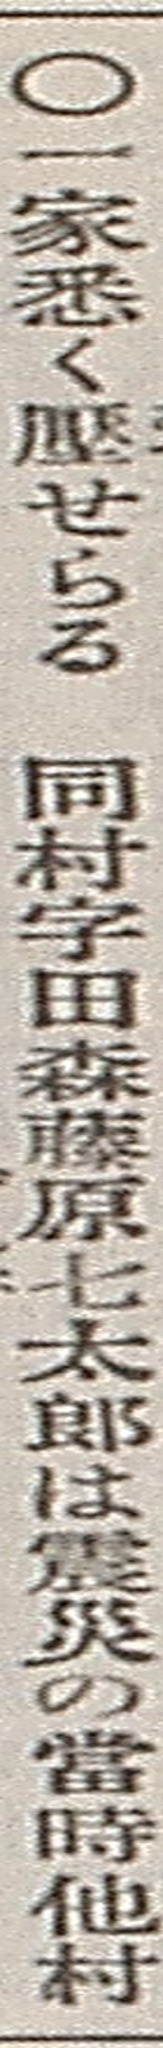〇一家悉く圧せらる同村字田森藤原七太郎は震災の当時他村
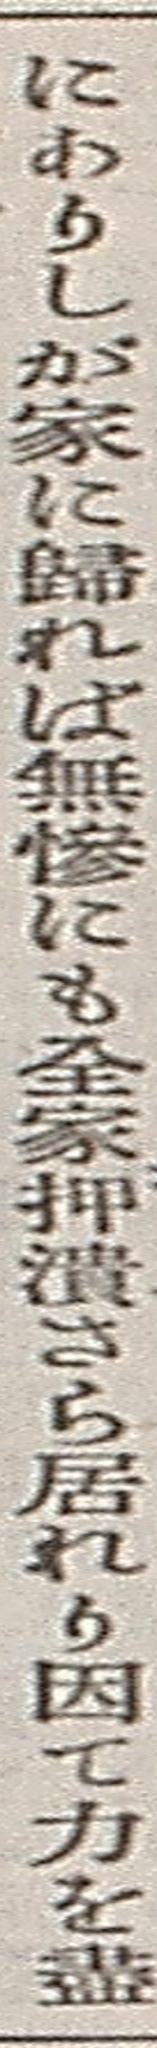にありしが家に帰れば無惨にも全家押潰さら居れり因て力を尽
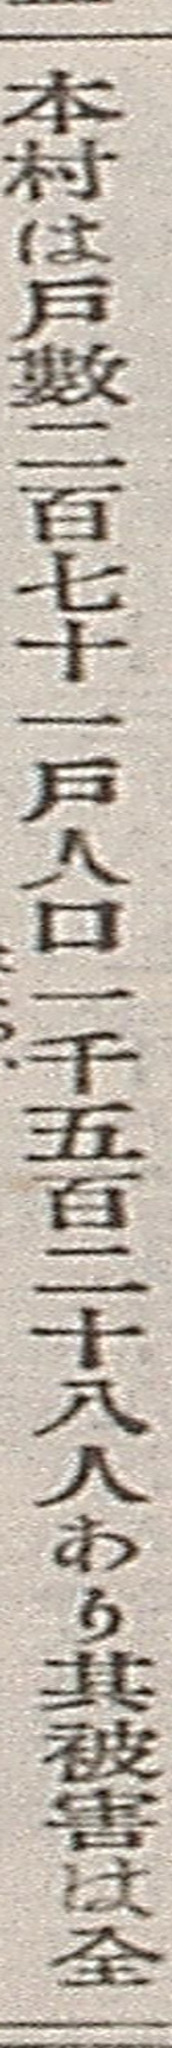本村は戸数二百七十一戸人口一千五百ニ十八人あり其被害は全
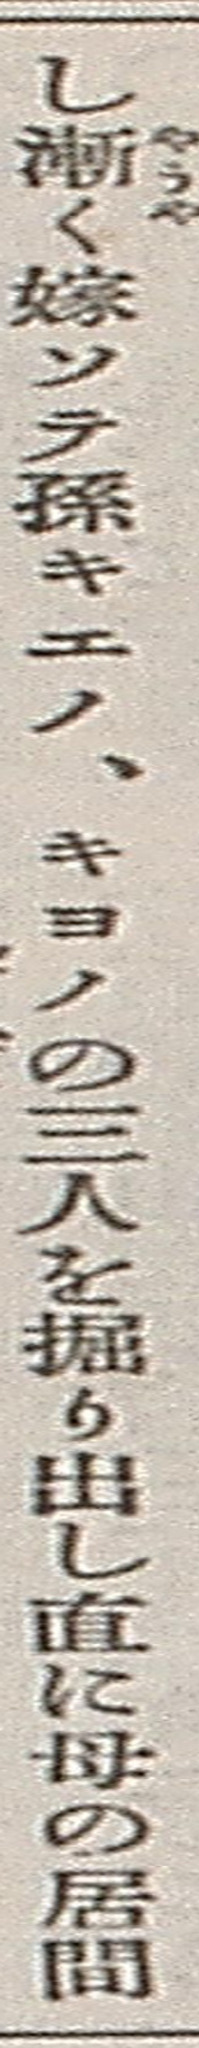し漸く嫁ソテ孫キエノ、キヨノの三人を掘り出し直に母の居間
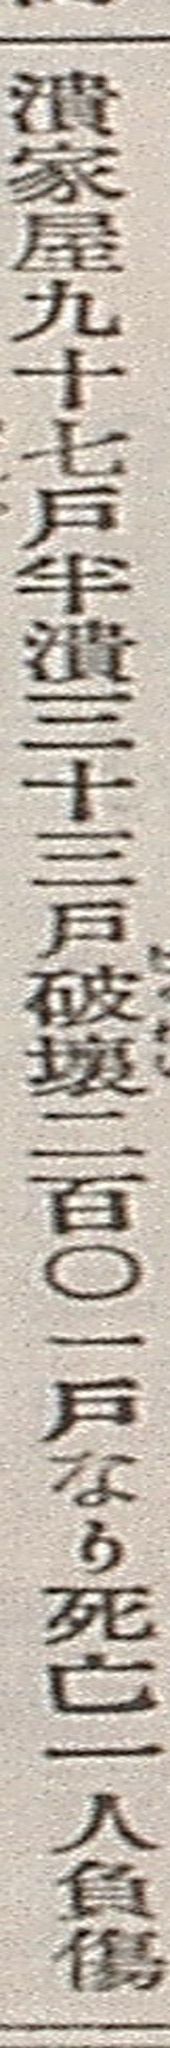潰家屋九十七戸半潰三十三戸破壊二百〇一戸なり死亡一人負傷
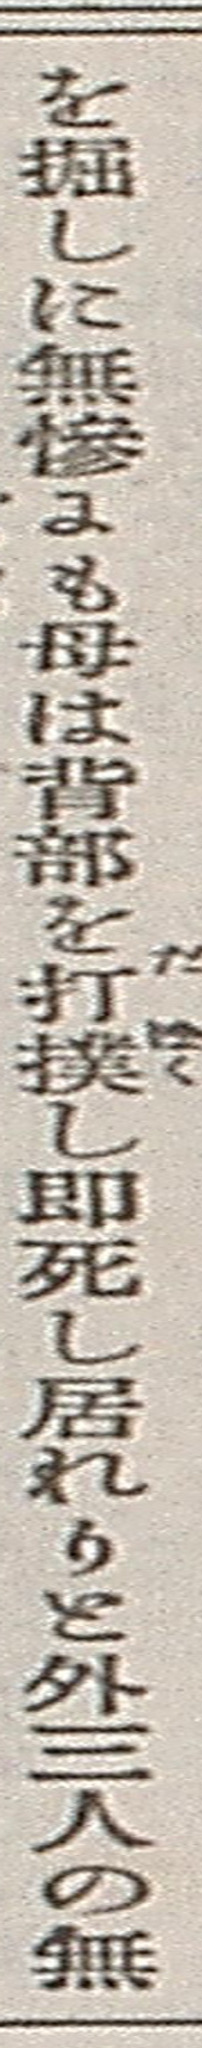を掘しに無惨にも母は背部を打撲し即死し居れりと外三人の無
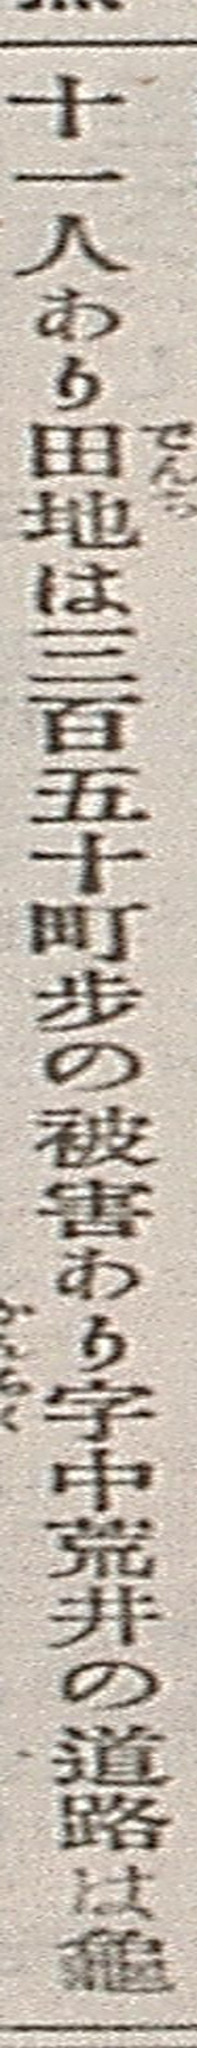十一人あり田地は三百五十町歩の被害あり字中荒井の道路は亀
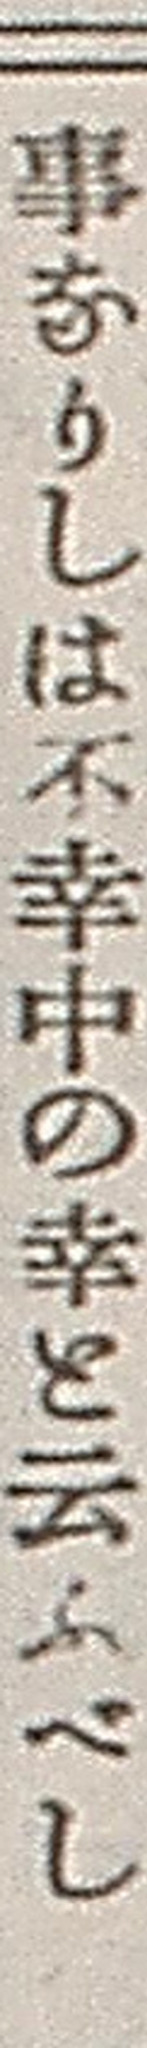事なりしは不幸中の幸と云ふべし
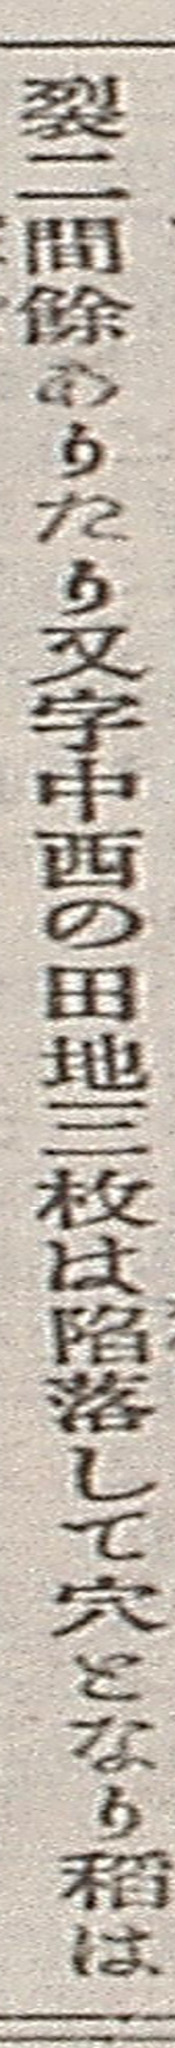裂二間余ありたり又字中西の田地三枚は陥落して穴となり稲は
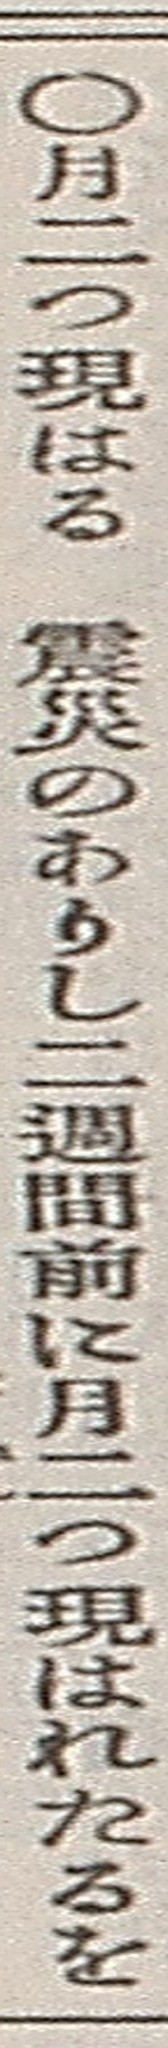〇月二つ現はる震災のありし二週間間に月二つ現はれたるを
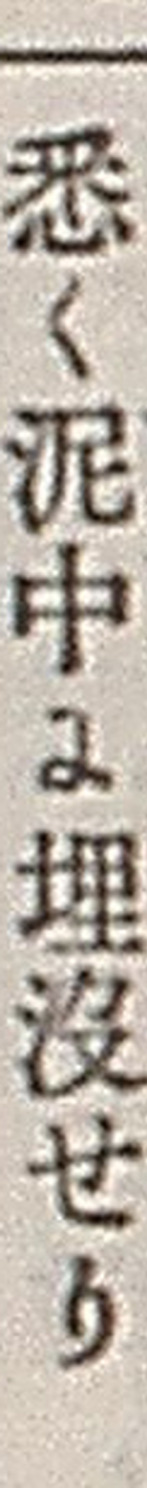悉く泥中に埋没せり
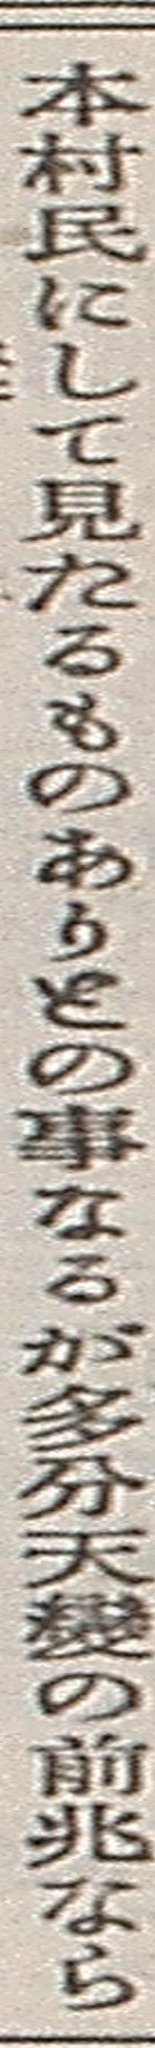本村民にして見たるものありとの事なるが多分天変の前兆なら
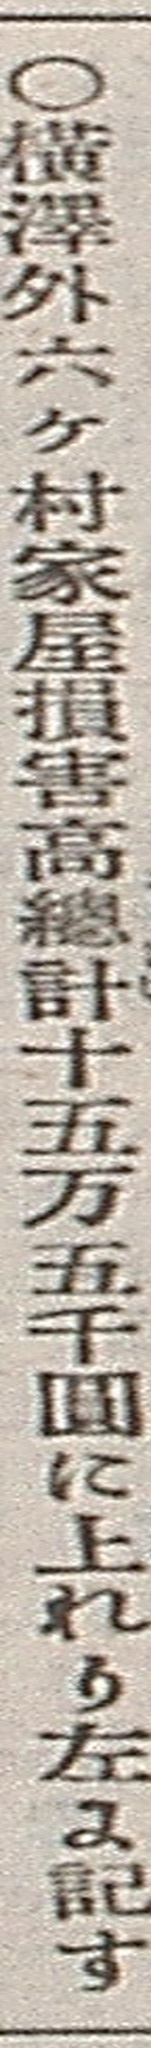〇横沢外六ケ村家屋損害高総計十五万五千円に上れり左に記す
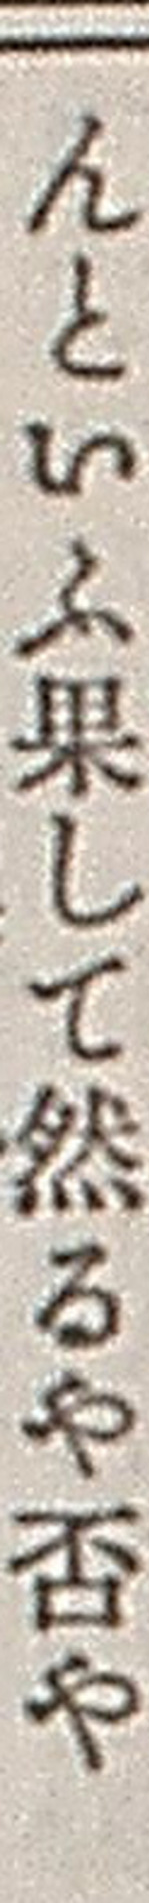んといふ果して然るや否や
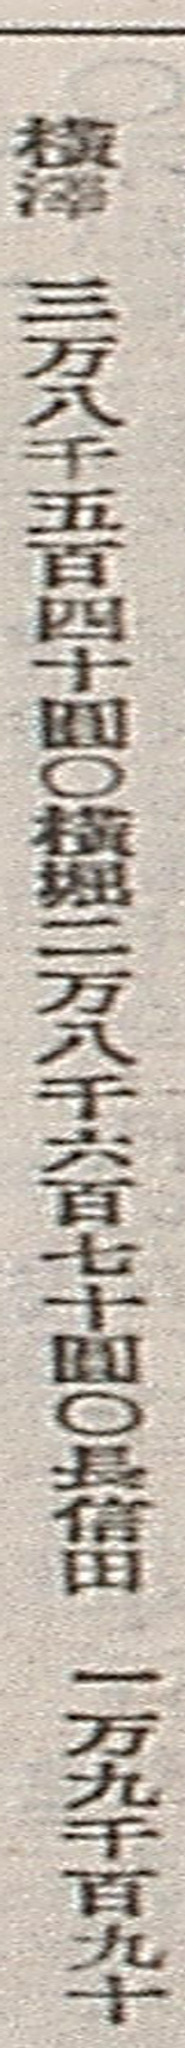横沢三万八千五百四十円〇横堀二万八千六百七十円〇長信田一万九千百九十
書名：風俗畫報臨時増刊第百二十四號　洪水地震被害録（上）
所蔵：東京大学地震研究所図書室 Earthquake Research Institute Library, The University of Tokyo, JAPAN
